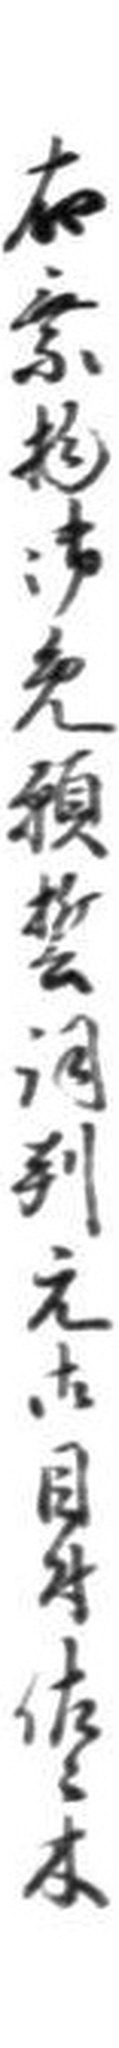右乗物御免願誓詞判元御目付佐々木
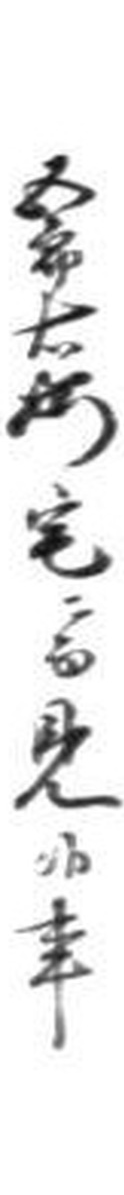五郎右衛門宅ニ而見候事
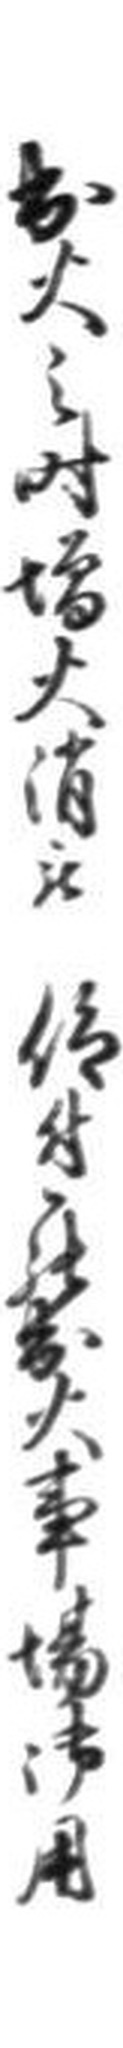出火之時増火消被仰付罷出火事場御用

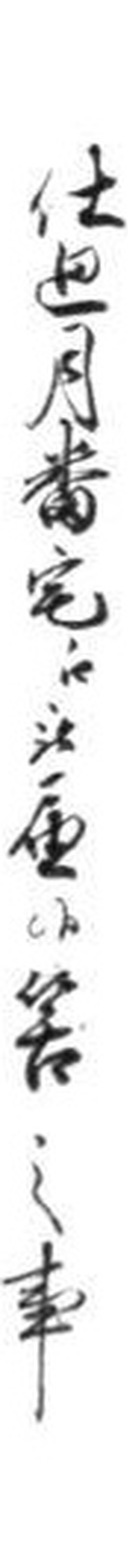仕廻月番宅江被届候筈之事
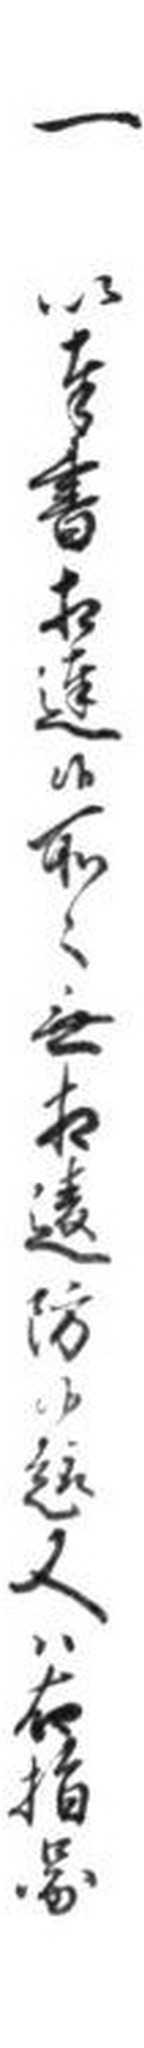一以奉書相達候所々無相違防候趣又ハ右指図
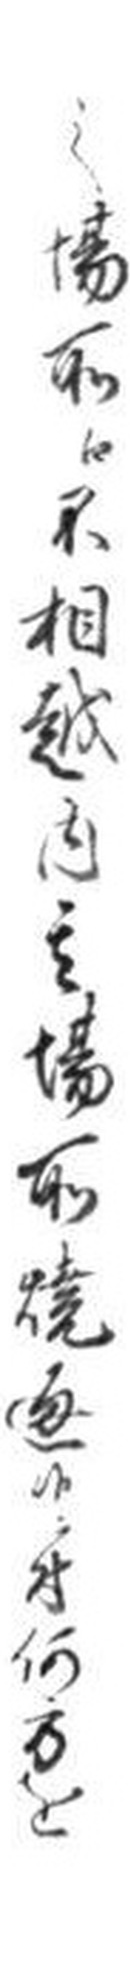之場所江不相越内其場所焼通候ニ付何方を
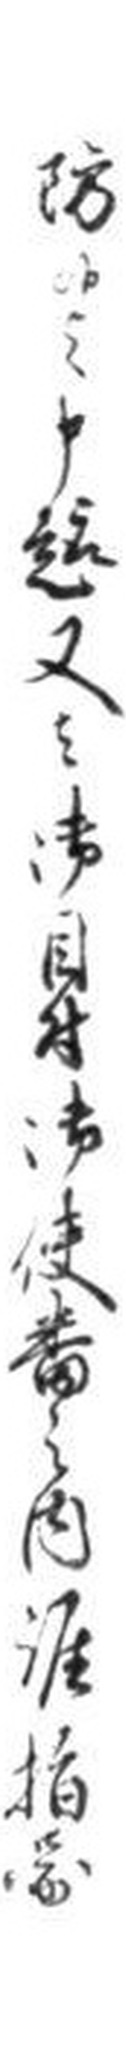防候与申趣又者御目付御使番之内誰指図
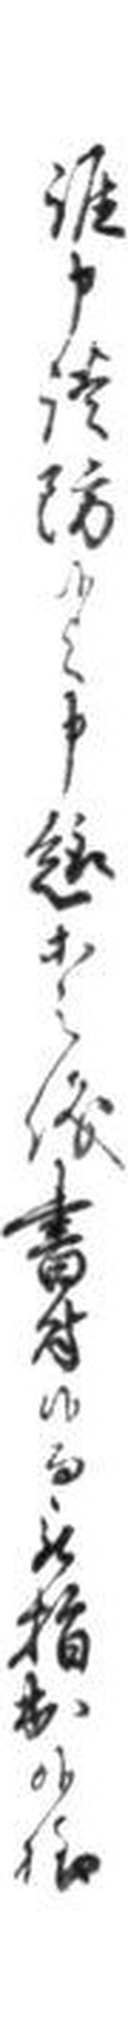誰申談防候与申趣等之儀書付候而被指出候様
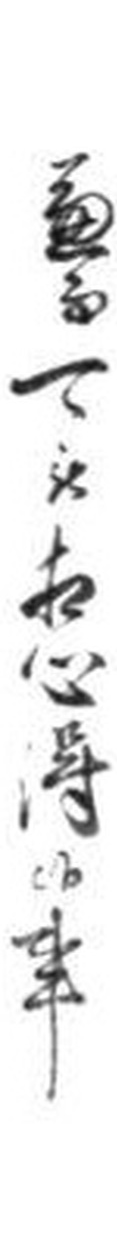兼而可被相心得候事
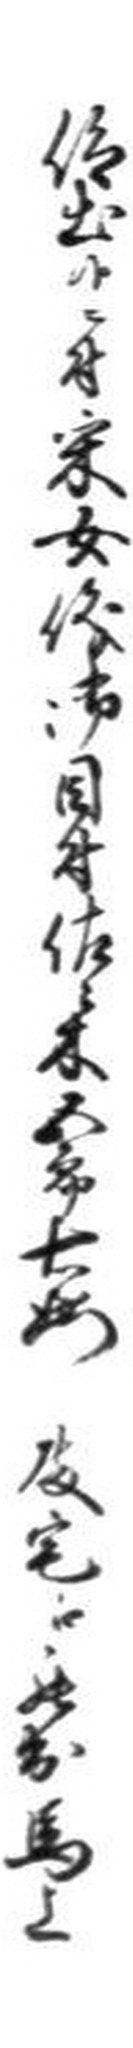仰出候ニ付采女儀御目付佐々木五郎右衛門殿宅江罷出馬上
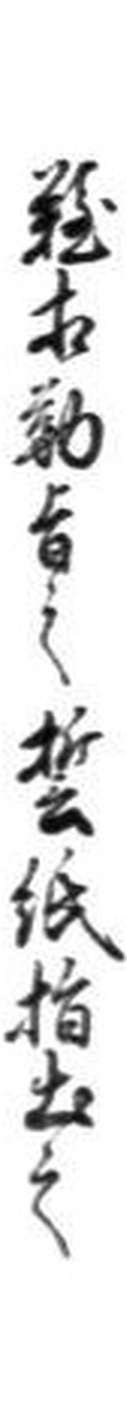難相勤旨之誓紙指出之
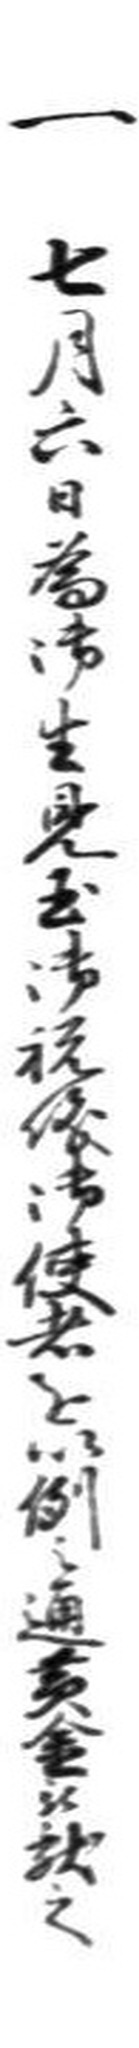一七月六日為御生見玉御祝儀御使者を以例之通黄金被献之
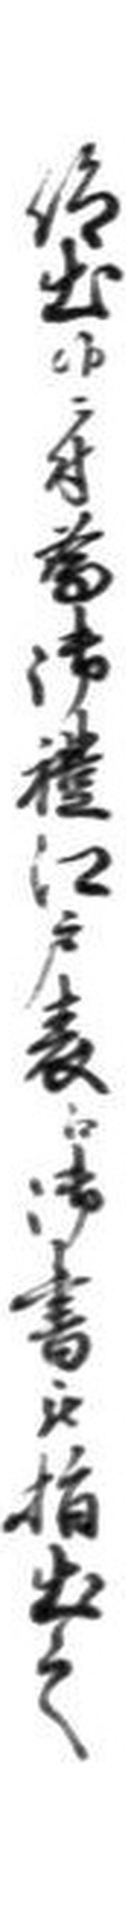仰出候ニ付為御礼江戸表江御書被出之
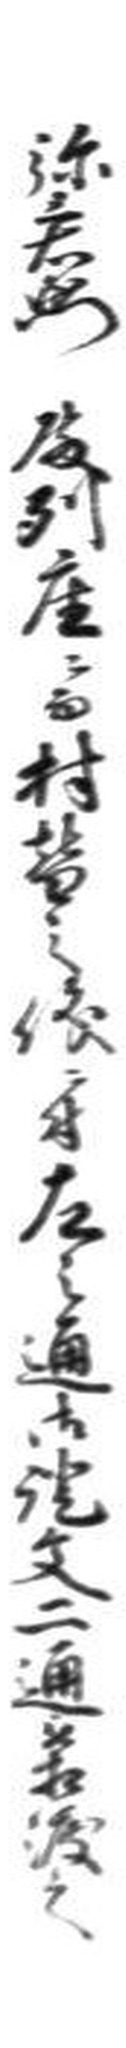弥三右衛門殿列座ニ而村替之儀ニ付左之通御証文二通被相渡之
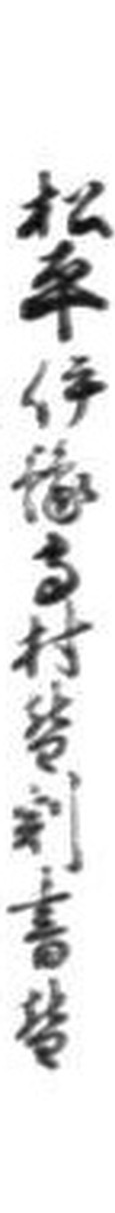松平伊予守村替割書替

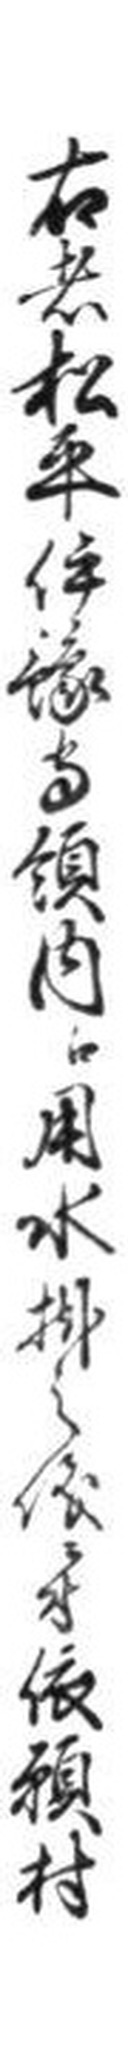右者松平伊予守領内江用水掛之儀ニ付依願村
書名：家譜 三十三 吉邦公 享保四年
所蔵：福井県文書館 Fukui Prefectural Archives
